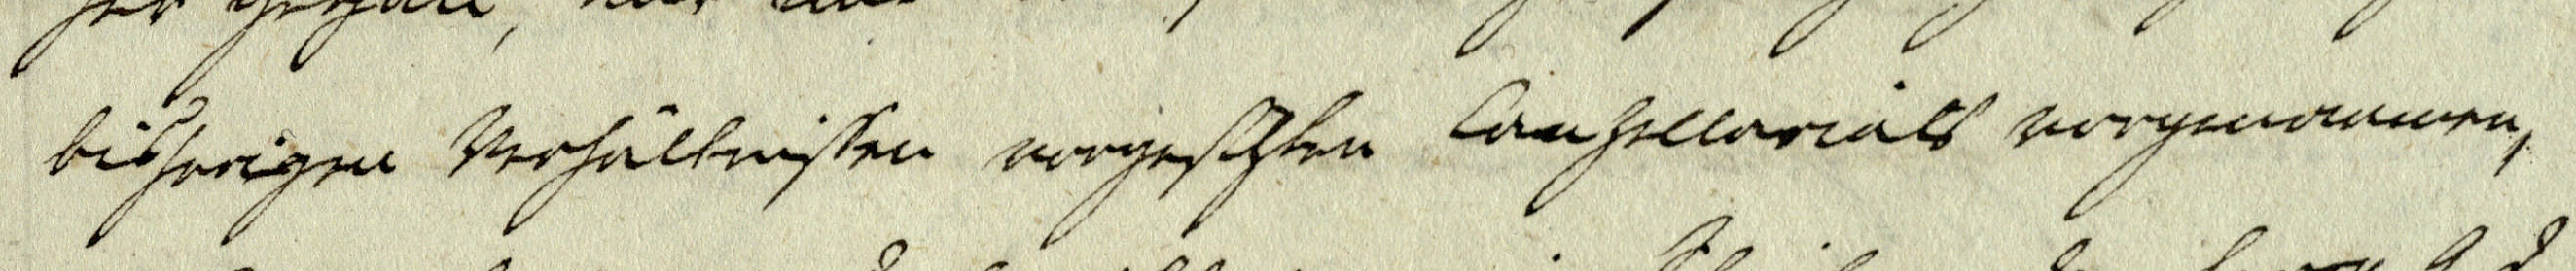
bisherigen Verhältnissen vorgesetzten Canzellariats vorgenommen,
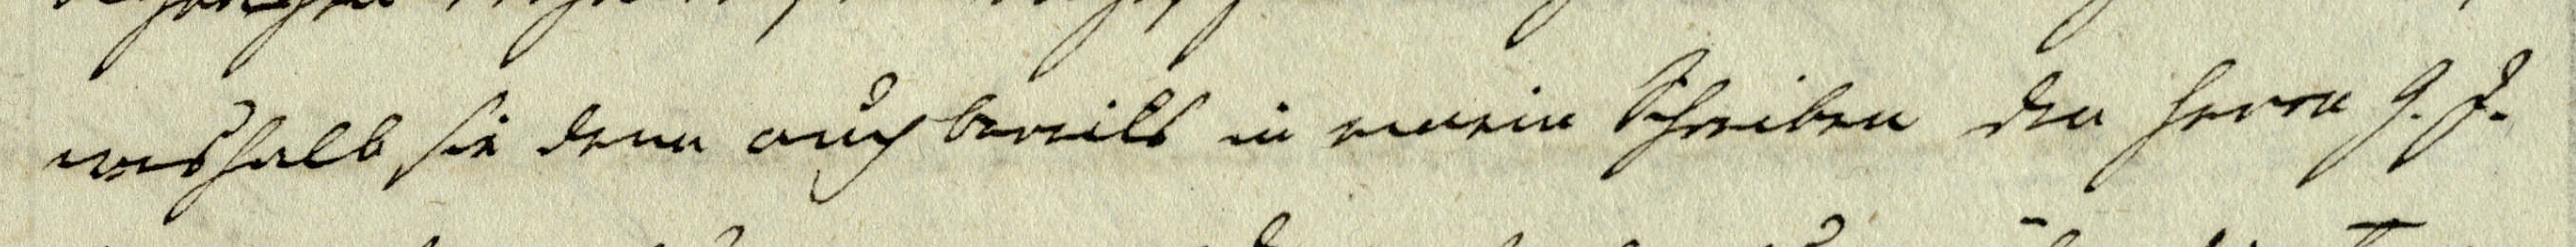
weshalb sie denn auch bereits in einem Schreiben den Herrn G.J.
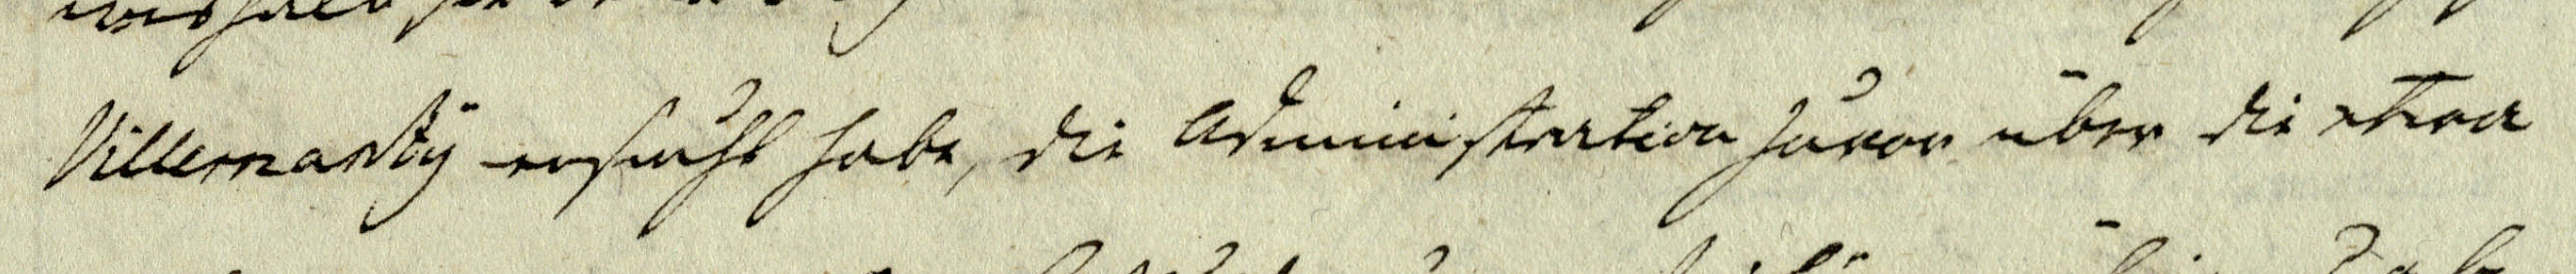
Villemantÿ ersucht habe, die Administration zuvor über die etwa
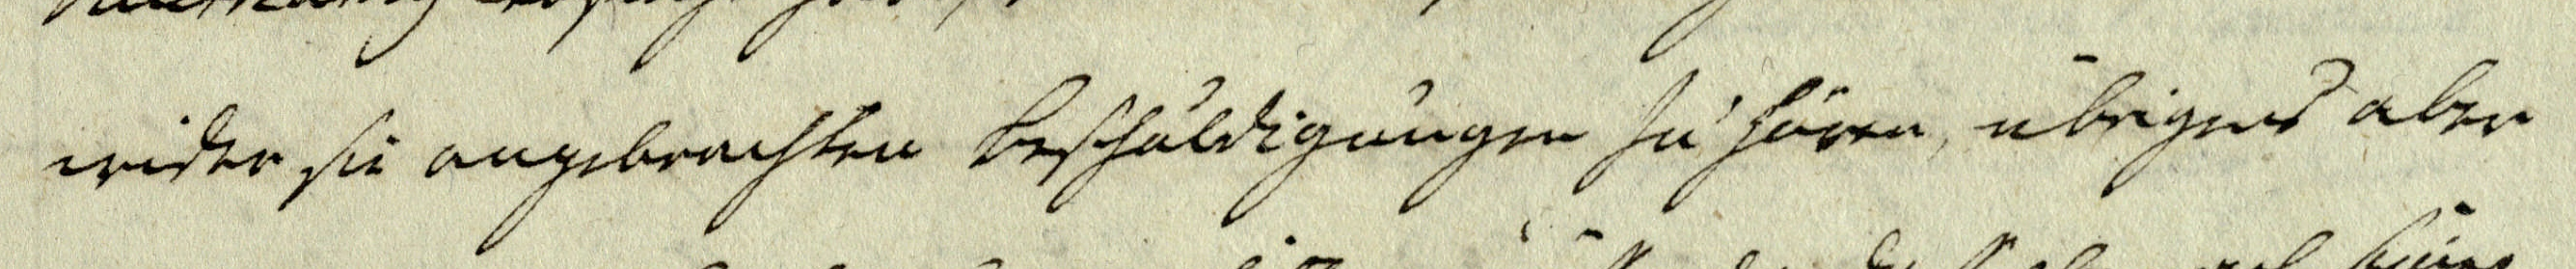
wider sie angebrachten Beschuldigungen zu hören, übrigens aber
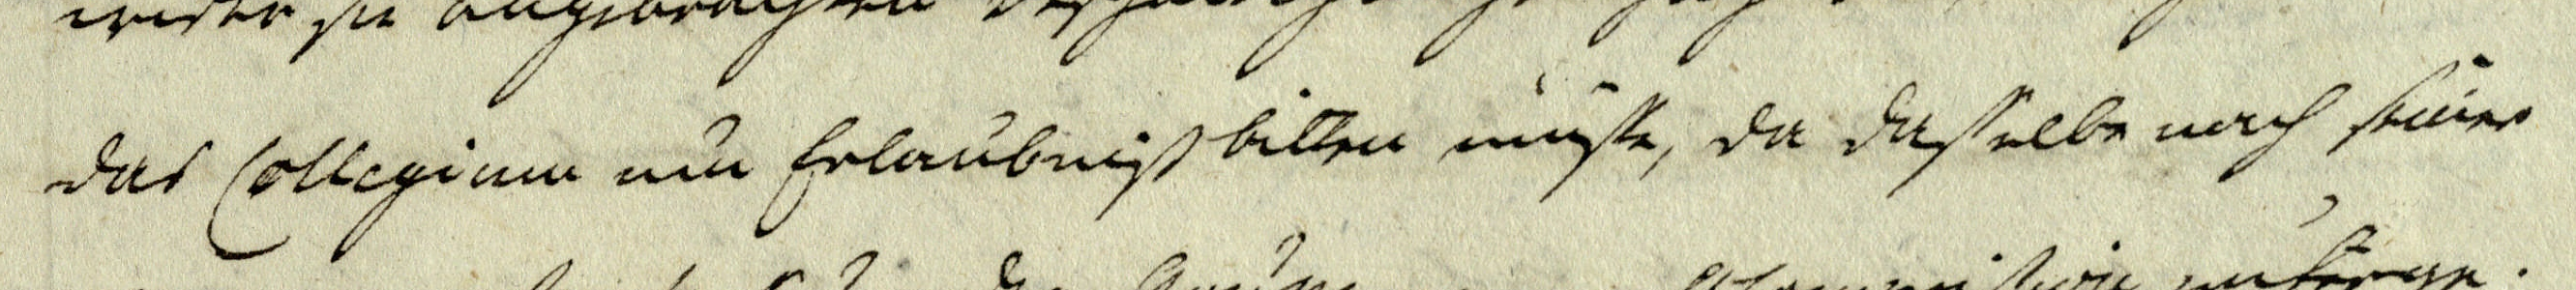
das Collegium um Erlaubnis bitten müsse, da dasselbe nach seiner
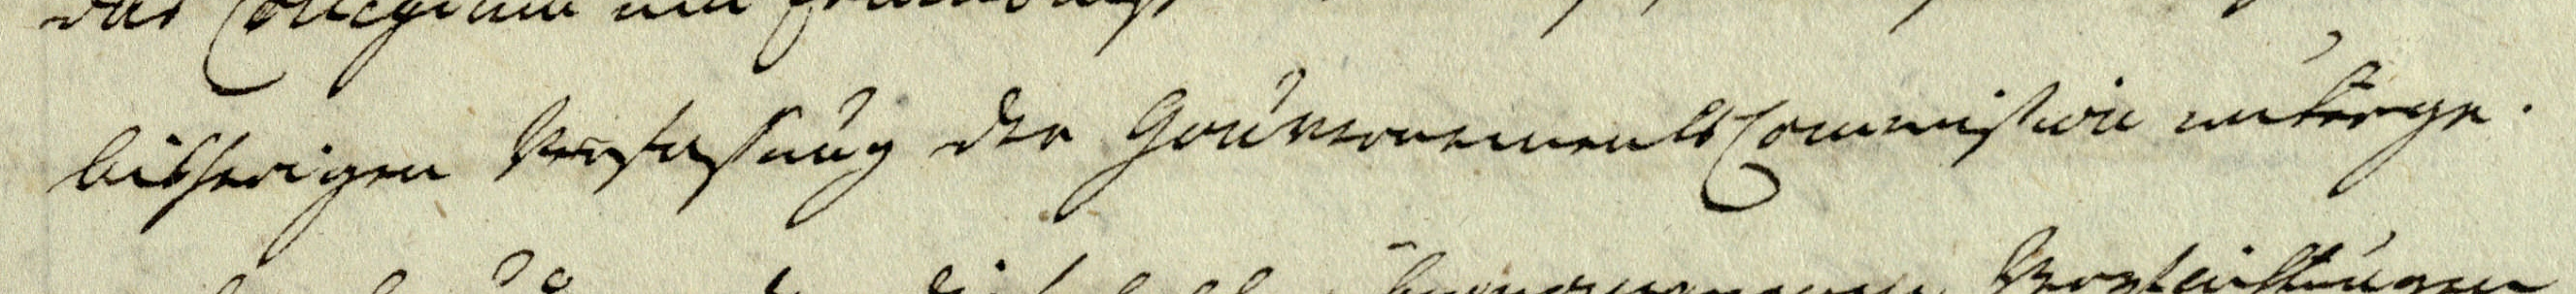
bisherigen Verfassung der Gouvernements Commission unterge¬
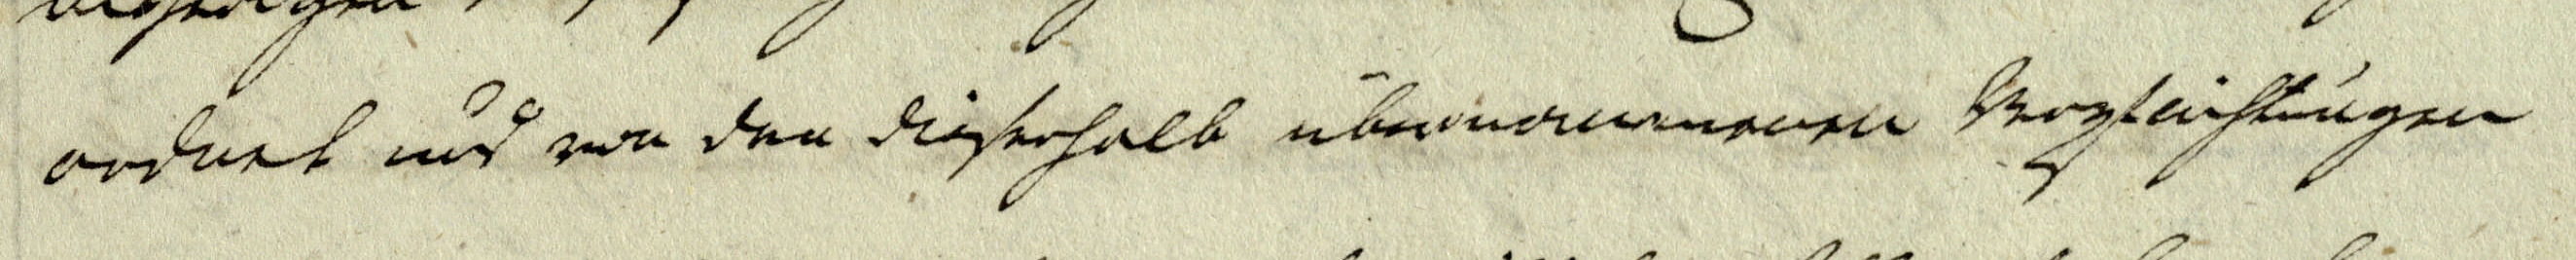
ordnet und von den dieserhalb übernommenen Verpflichtungen
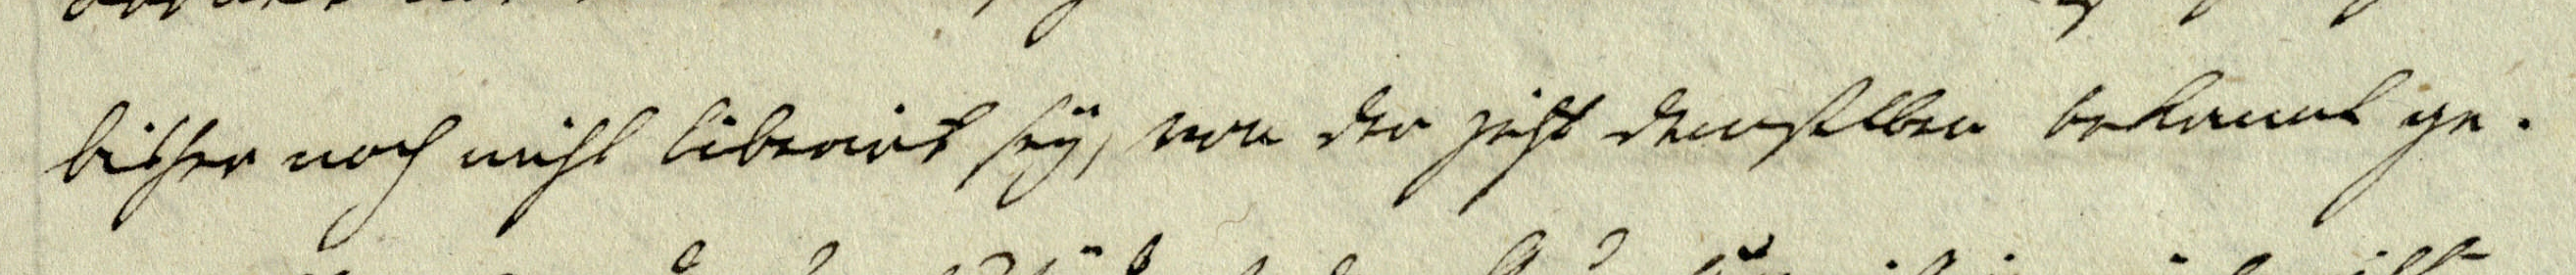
bisher noch nicht liberirt seÿ, von der jetzt demselben bekannt ge¬
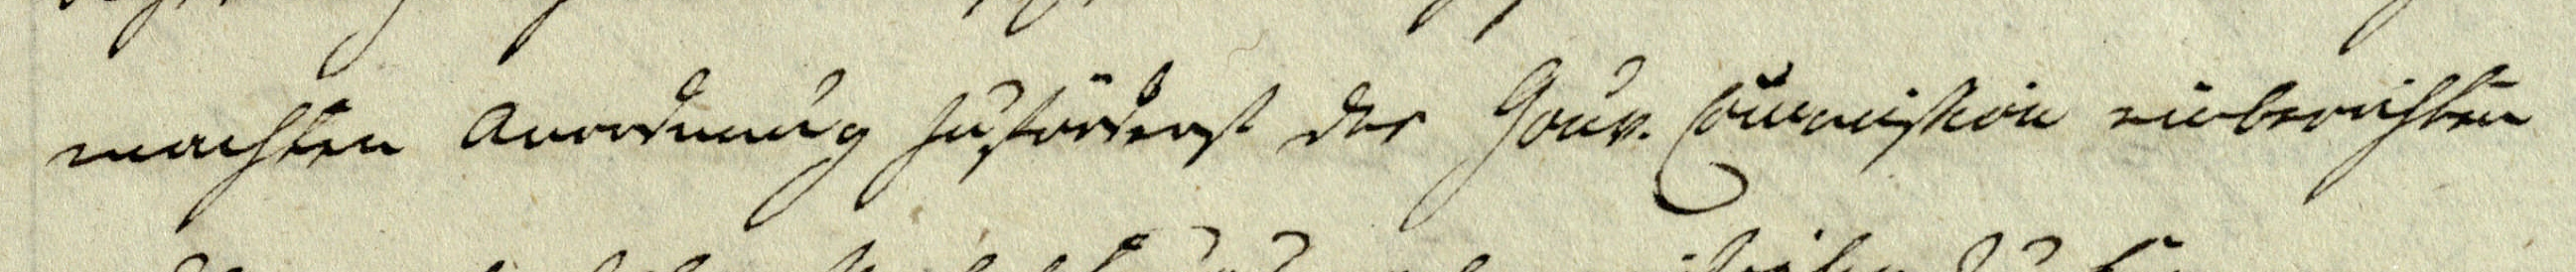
machten Anordnung zuförderst der Gouv. Commission einberichten
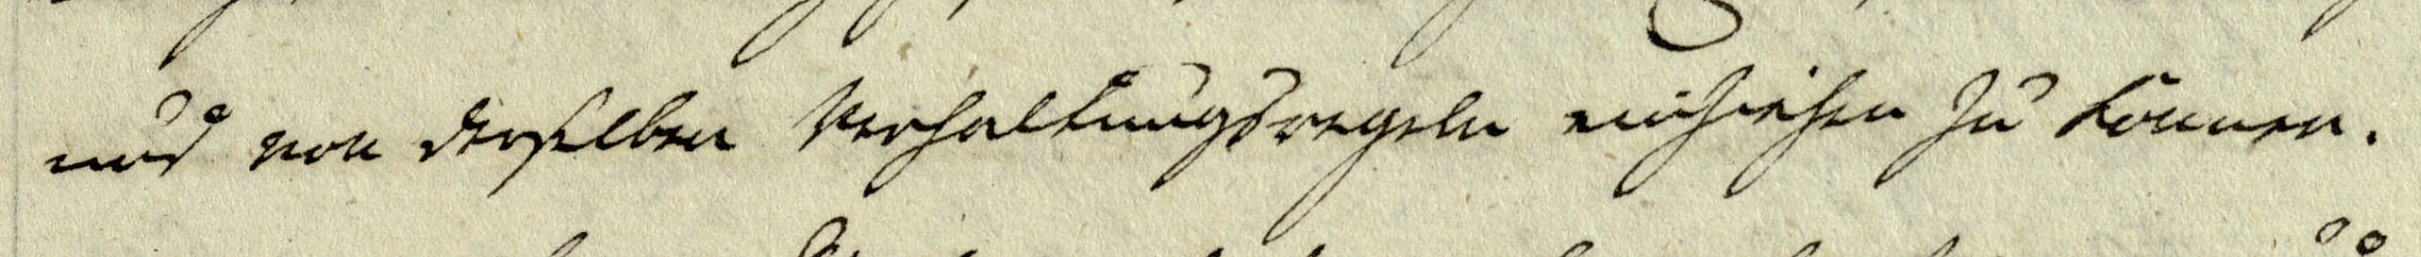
und von derselben Verhaltungsregeln einziehen zu können.
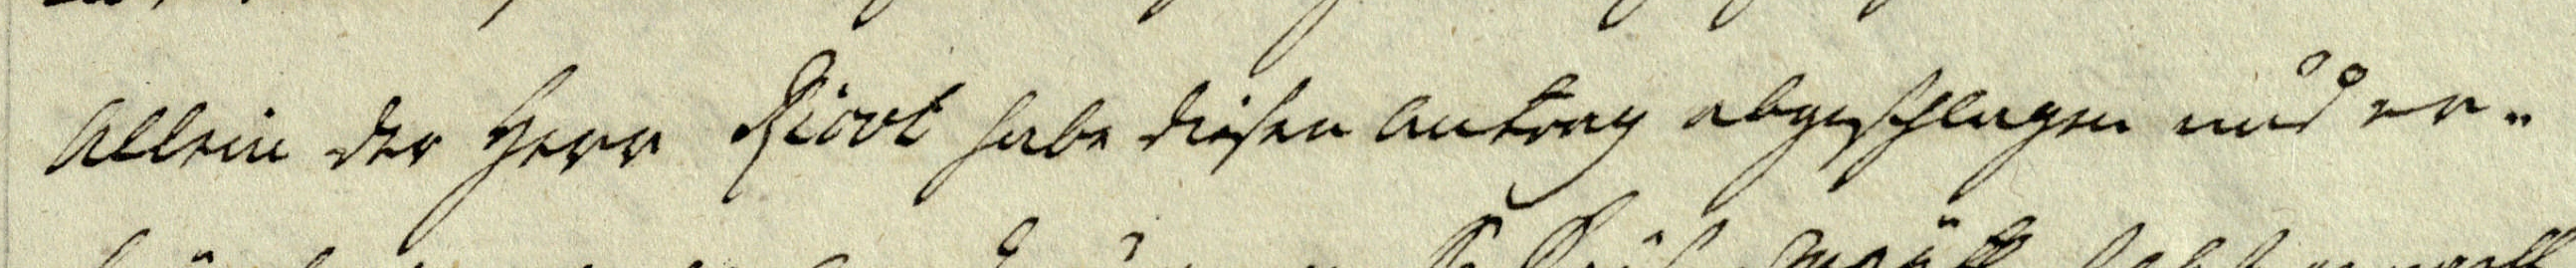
Allein der Herr Ricot habe diesen Antrag abgeschlagen und er¬
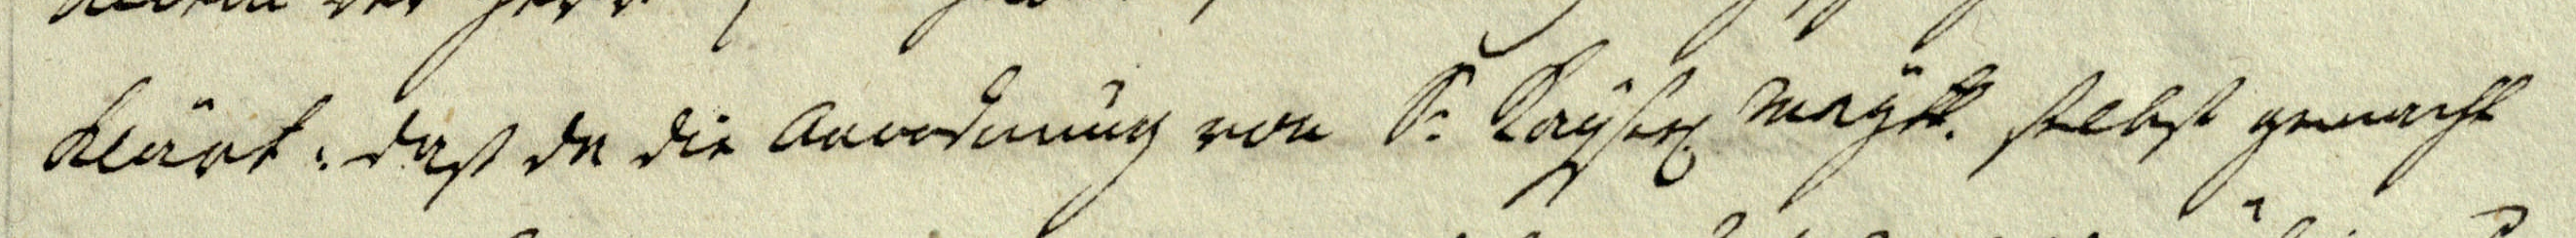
klärt: daß da die Anordnung von S. Kaÿserl. Maÿtt. selbst gemacht
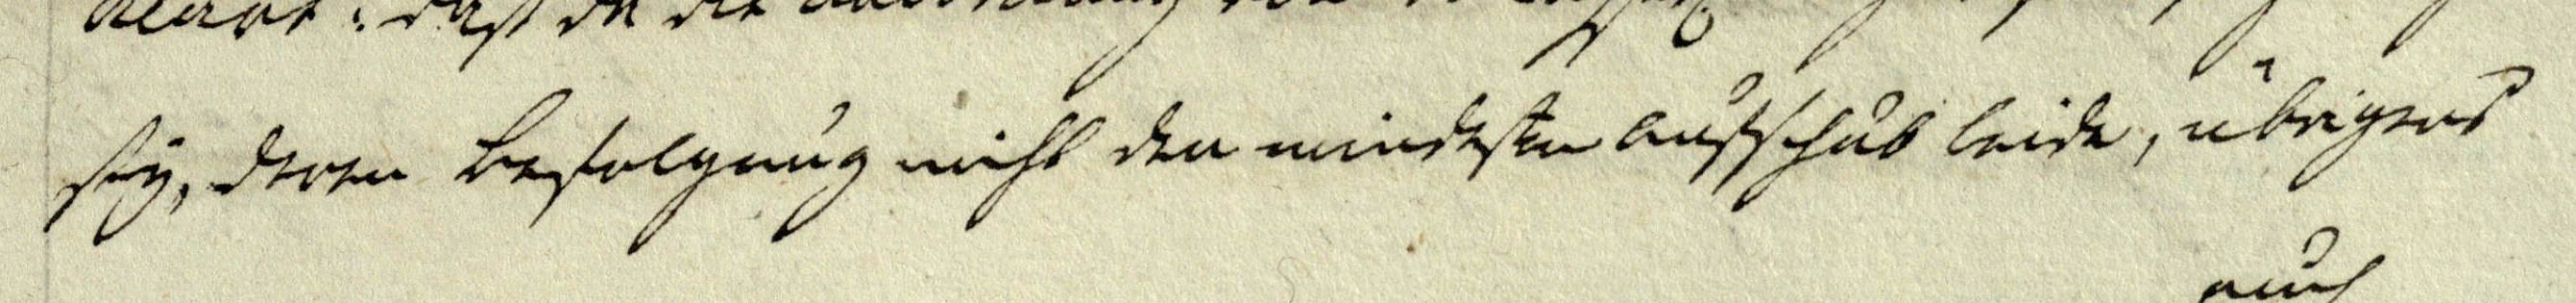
seÿ, deren Befolgung nicht den mindesten Aufschub leide, übrigens
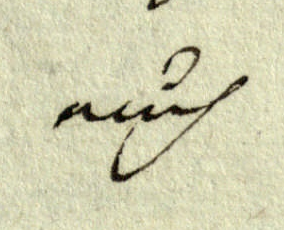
auch
